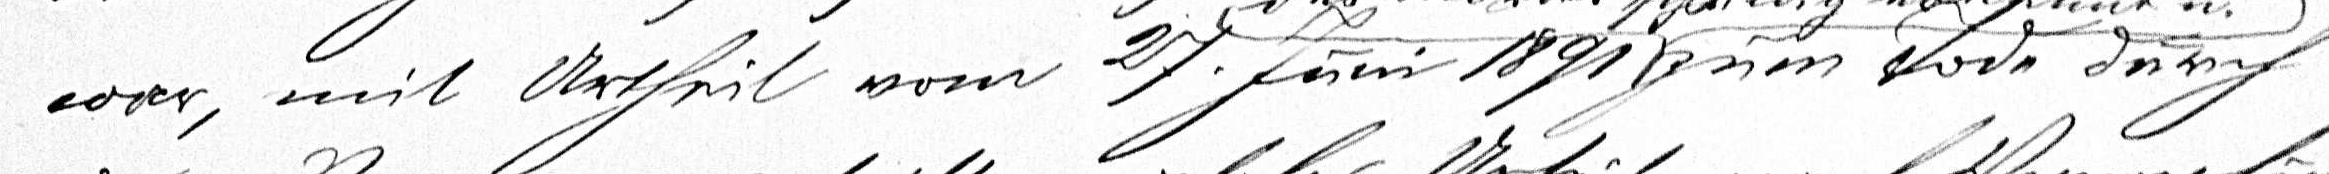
war, mit Urtheil vom 27. Juni 1891 zum Tode durch
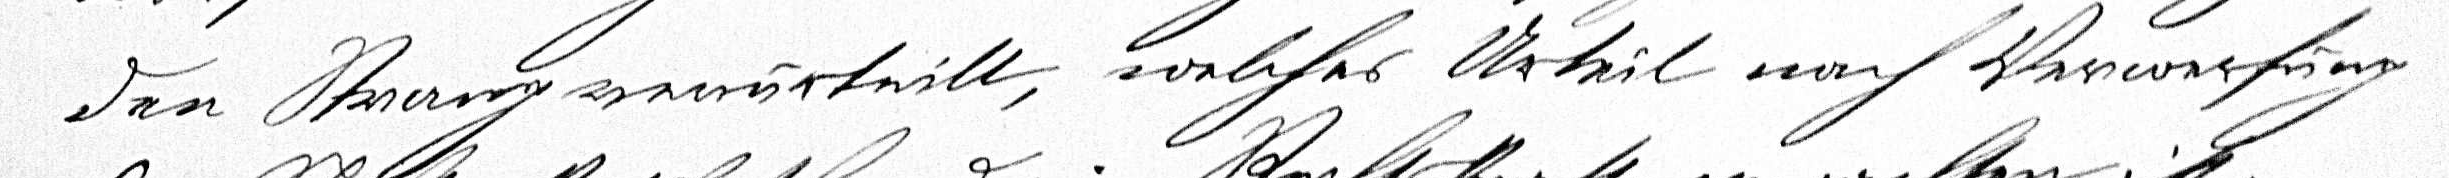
den Strang verurtheilt, welches Urtheil nach Verwerfung
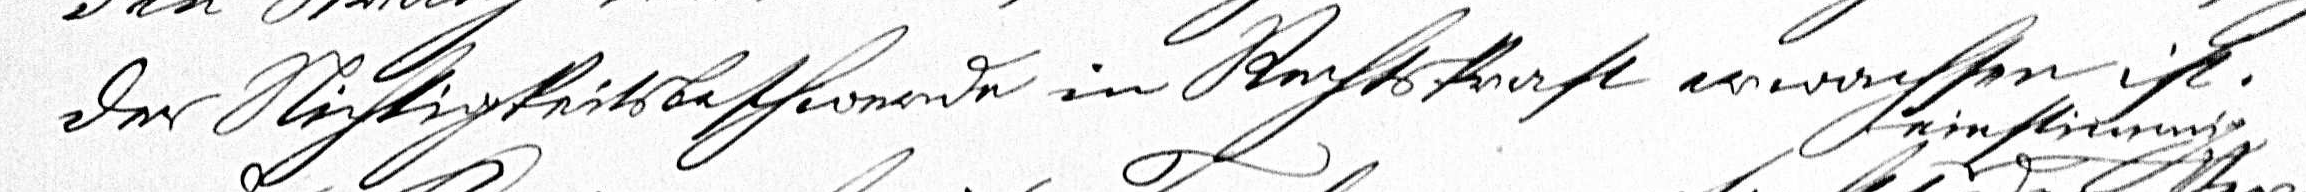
der Nichtigkeitsbeschwerde in Rechtskraft erwachsen ist.
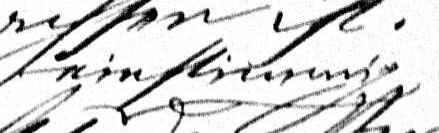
einstimmig
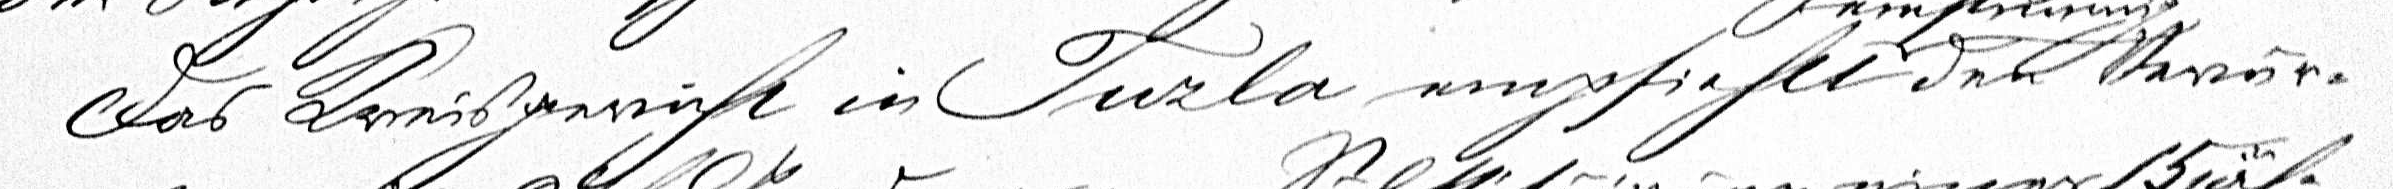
Das Kreisgericht in Tuzla empfiehlt den Verur¬
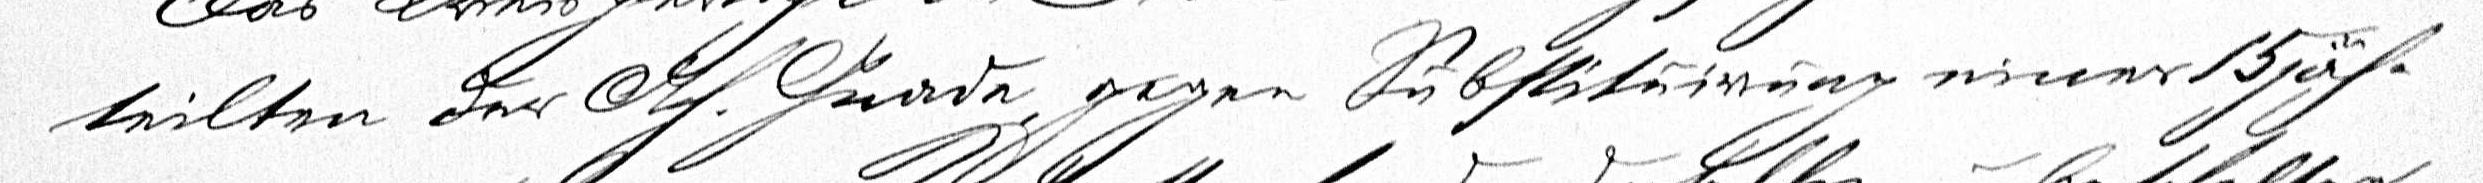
theilten der Ah. Gnade gegen Substituirung einer 15jäh¬
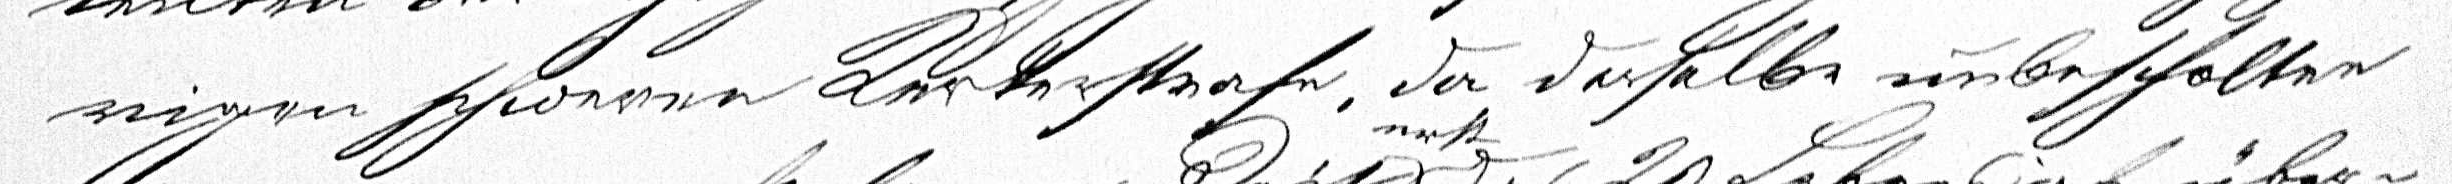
rigen schweren Kerkerstrafe, da derselbe unbescholten
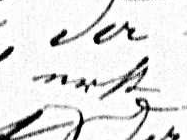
erst
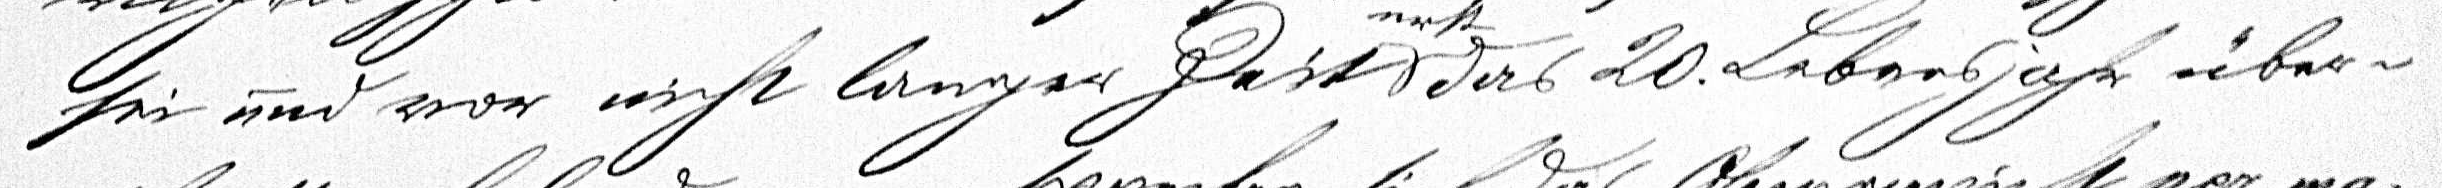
sei und vor nicht langer Zeit das 20. Lebensjahr über¬
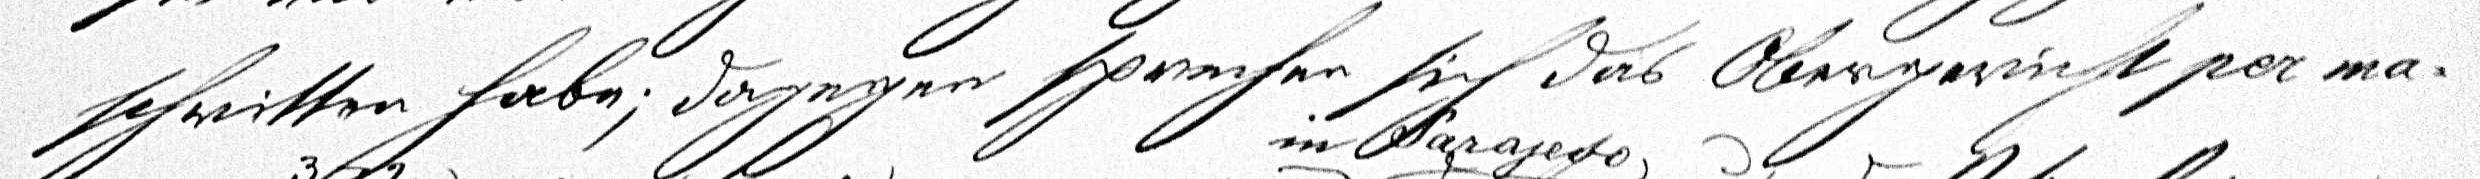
schritten habe; dagegen sprechen sich das Obergericht per ma¬
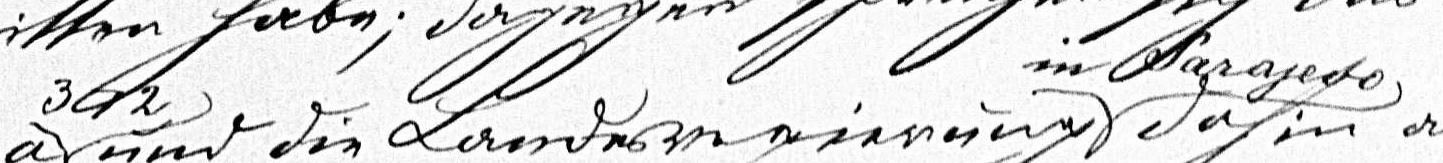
3>2 in Sarajevo
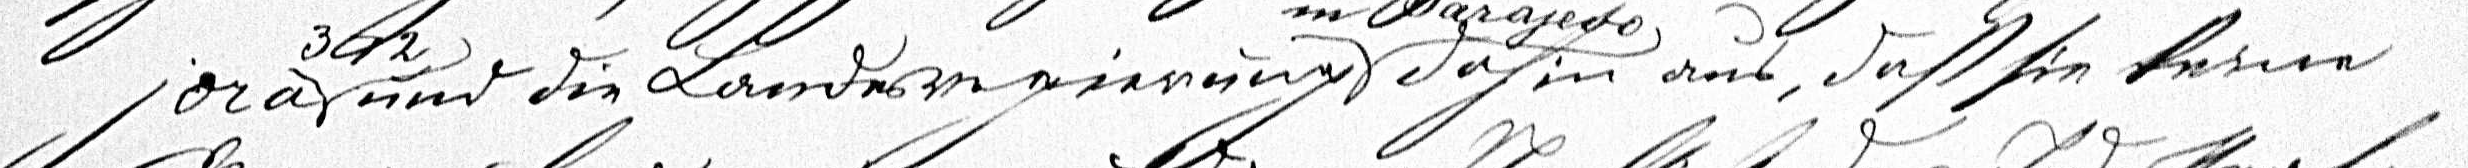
jora und die Landesregierung dahin aus, daß sie keine
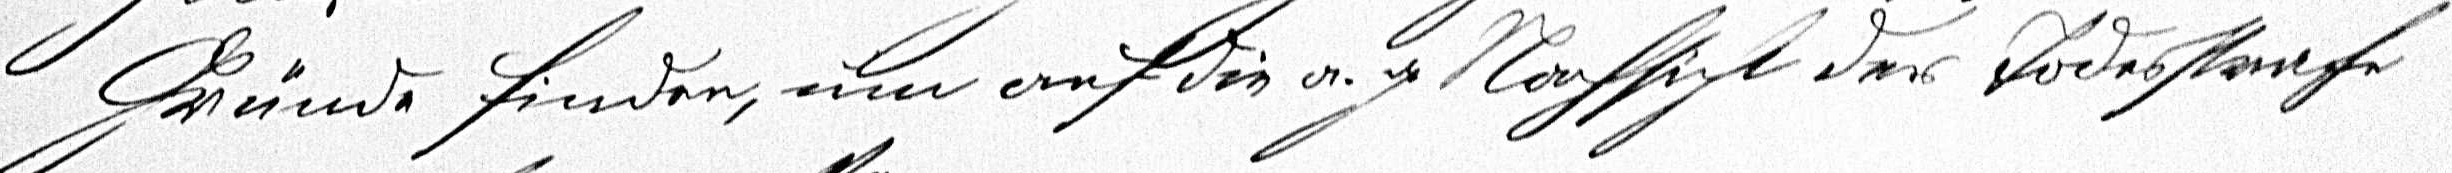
Gründe finden, um auf die a.g. Nachsicht der Todesstrafe
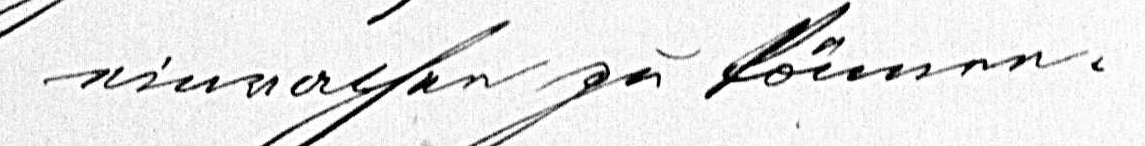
einrathen zu können.
